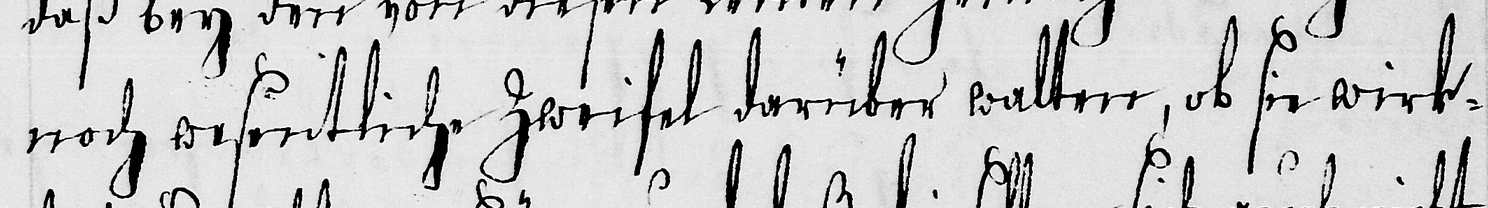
noch wesentliche Zweifel darüber walten, ob sie wirk¬
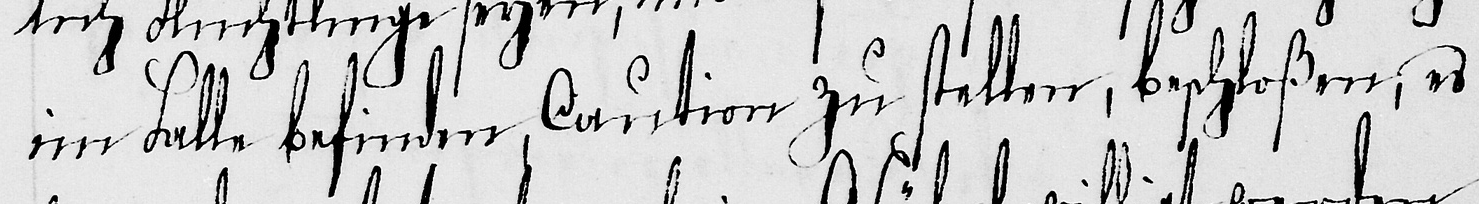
im Falle befinden, Caution zu stellen, beschloßen, es
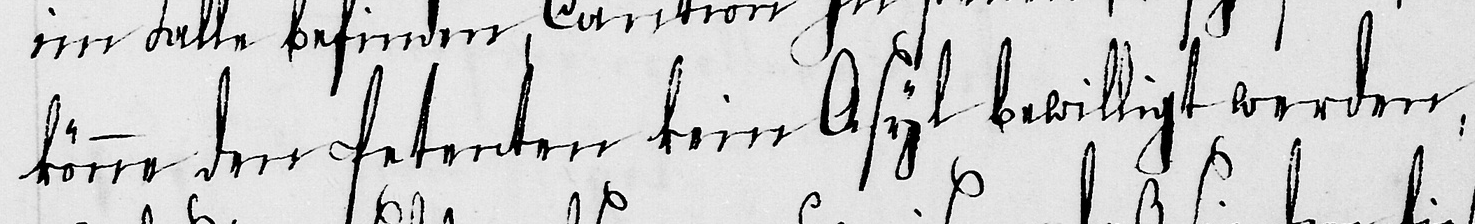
könne den Petenten kein Asyl bewilligt werden,
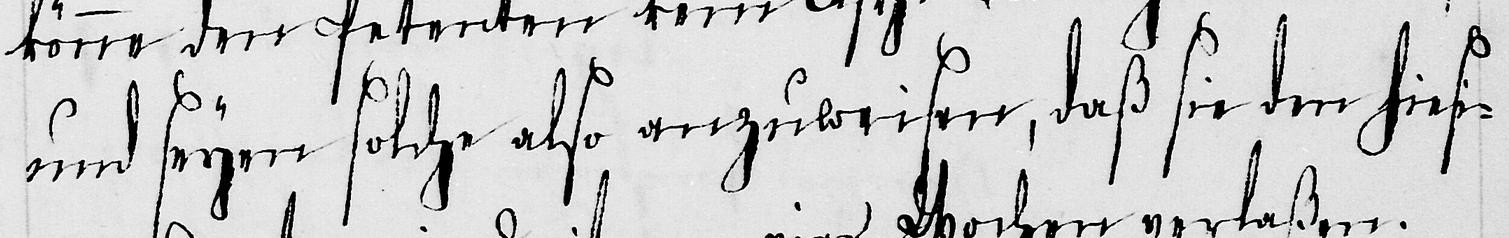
und seyen solche also anzuweisen, daß sie den hies¬
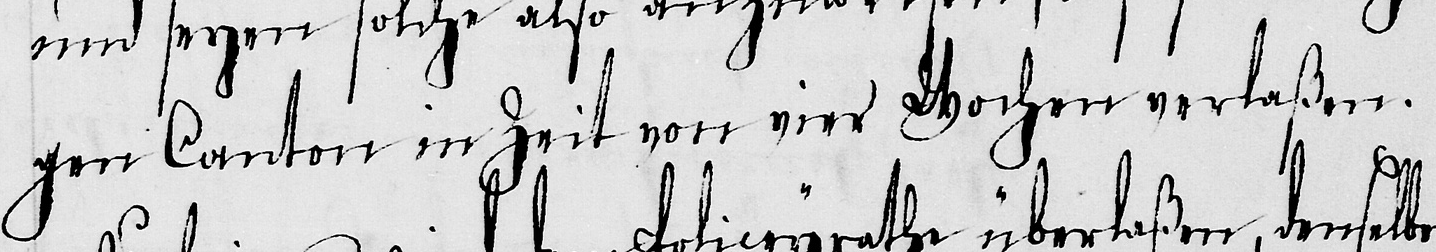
igen Canton in Zeit von vier Wochen verlaßen.
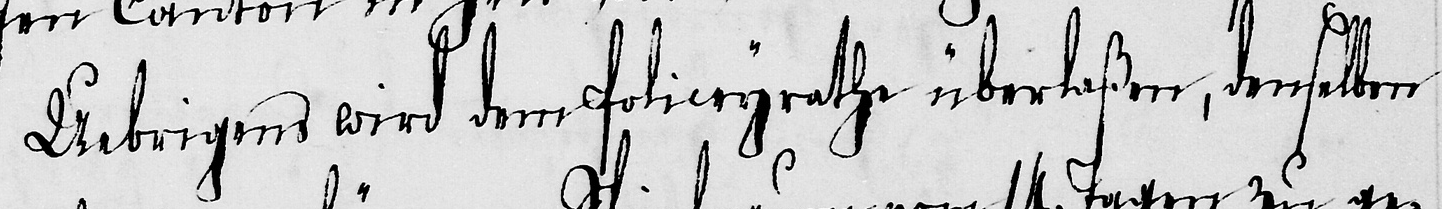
Uebrigens wird dem Policeyrathe überlaßen, denselben
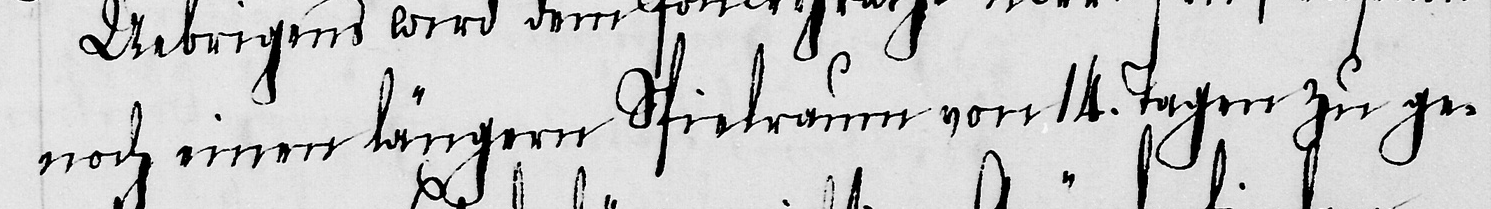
noch einen längern Spielraum von 14. Tagen zu ges¬
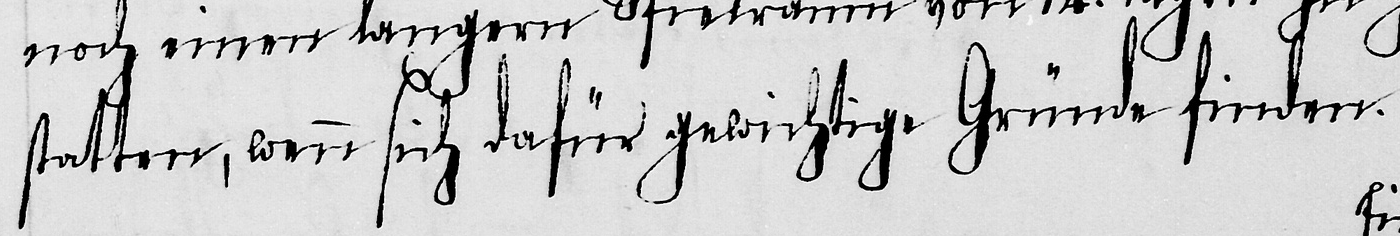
tatten, wenn sich dafür gewichtige Gründe finden.
